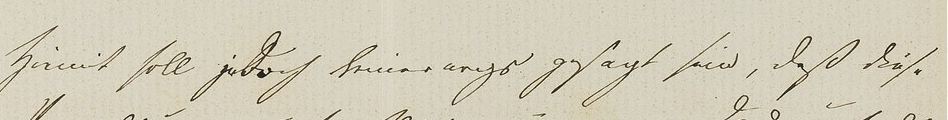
Hiemit soll jedoch keineswegs gesagt sein, daß diese
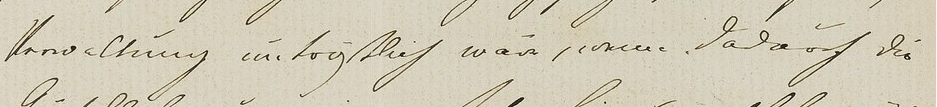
Verwaltung untröstlich wäre, wenn dadurch die
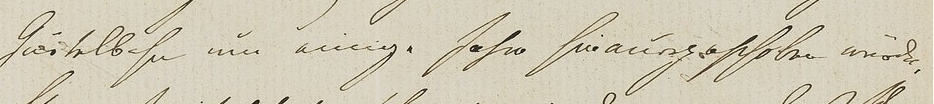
Gürtelbahn um einige Jahre hinausgeschoben würde.
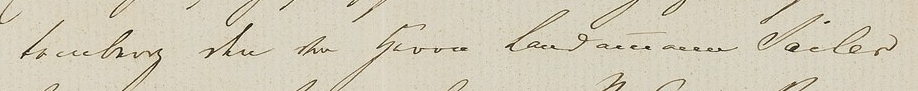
temberg den von Herrn Landammann Sailer
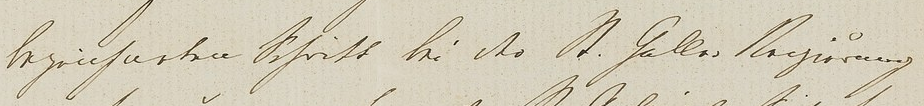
bezeichneten Schritt bei der St. Galler Regierung
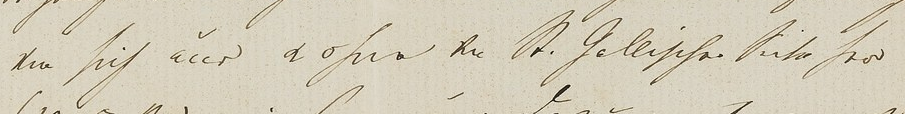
von sich aus & ohne von St. Gallischer Seite her
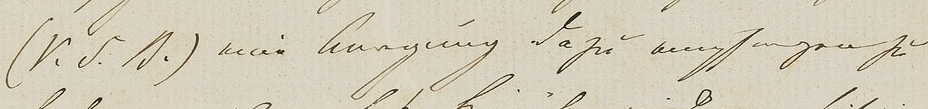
(V.S.B. ) eine Anregung dazu empfangen zu
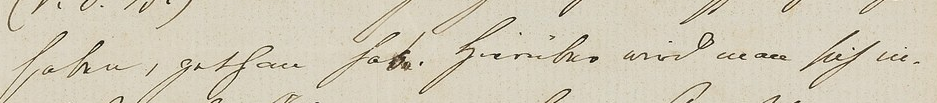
haben, gethan habe. Hierüber wird man sich in-
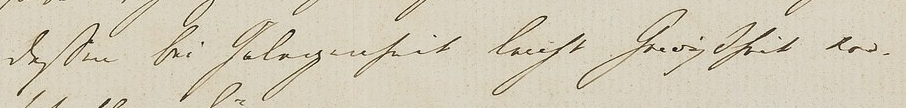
dessen bei Gelegenheit leicht Gewißheit ver-
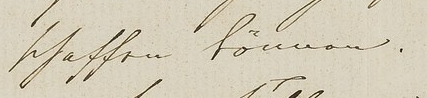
schaffen können.
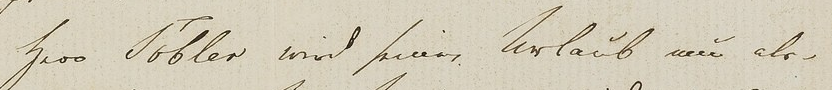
Herr Tobler wird seinen Urlaub nun als-
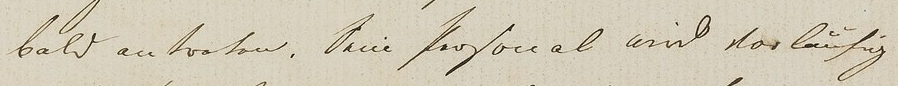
bald antreten. Sein Personal wird vorläufig
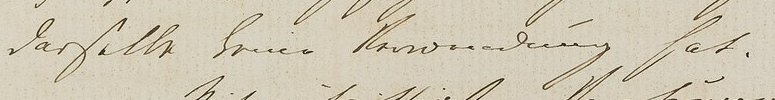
dasselbe keine Verwendung hat.
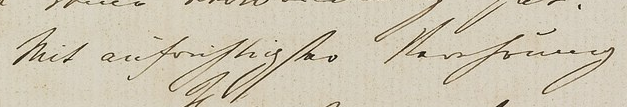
Mit aufrichtigster Verehrung
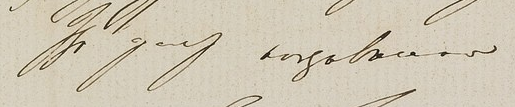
Ihr ganz ergebener
